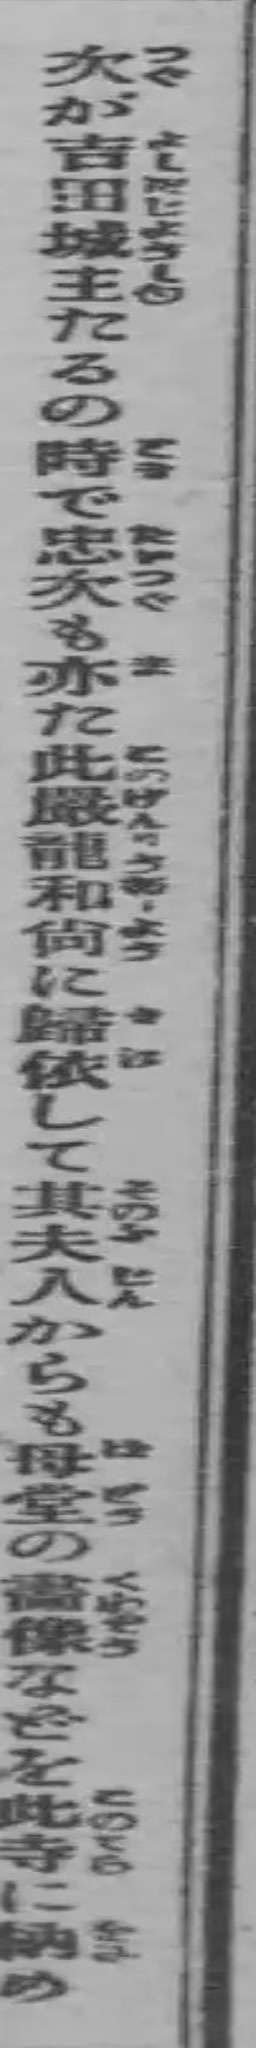次が吉田城主たるの時で忠次も亦た此厳龍和尚に帰依して其夫人からも母堂の画像などを此寺に納め
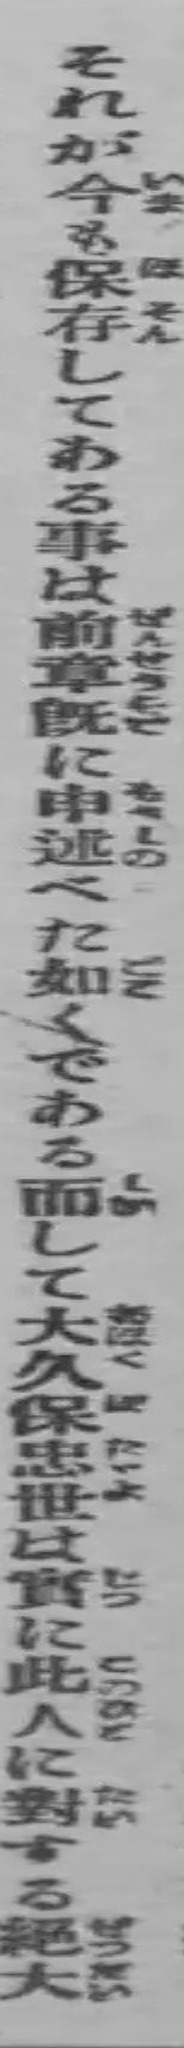それが今も保存してある事は前章既に申述べた如くである而して大久保忠世は実に此人に対する絶大
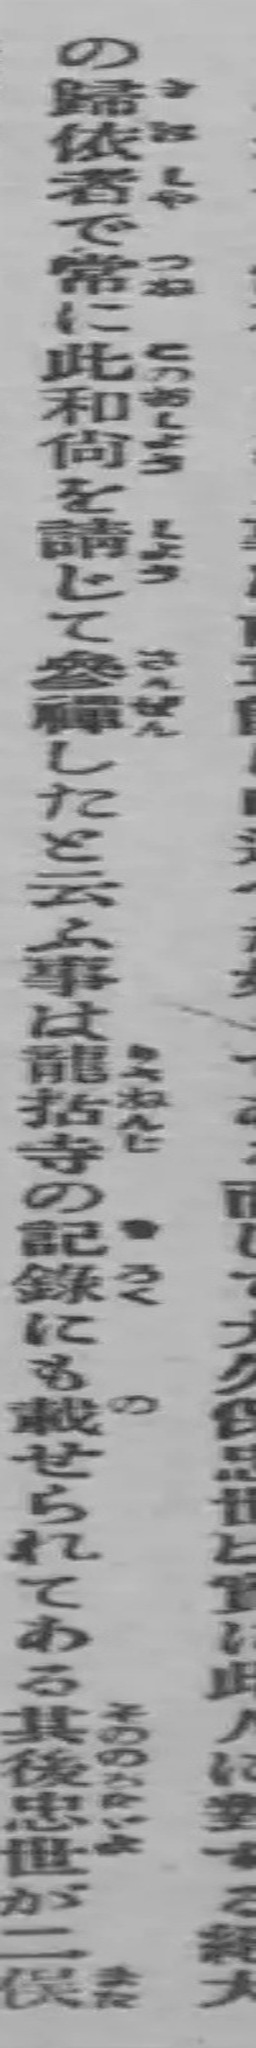の帰依者で常に此和尚を請じて参禅したと云ふ事は龍拈寺の記録にも載せられてある其後忠世が二俣
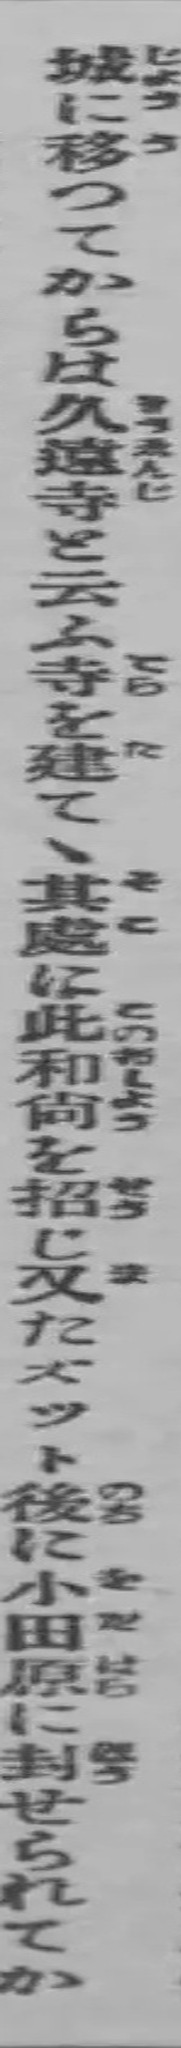城に移つてからは久遠治寺と云ふ寺を建てゝ其処に此和尚を招じ又たズツト後に小田原に封せられてか
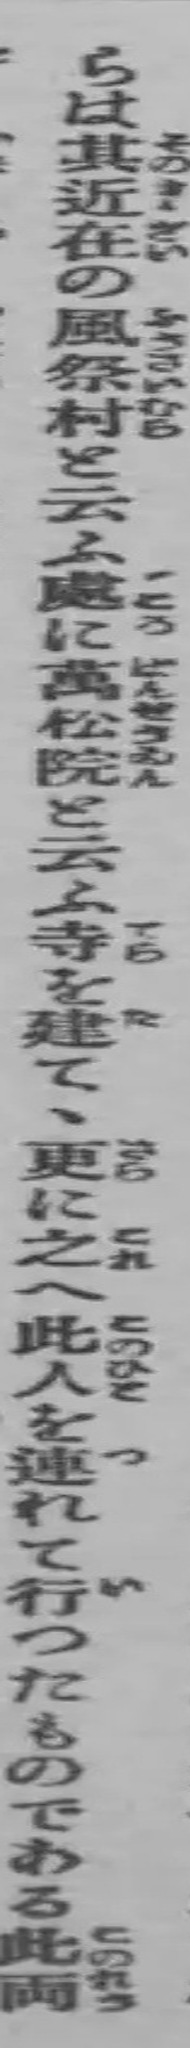らは其近在の風祭村と云ふ処に万松院と云ふ寺を建てゝ更に之へ此人を連れて行つたものである此両
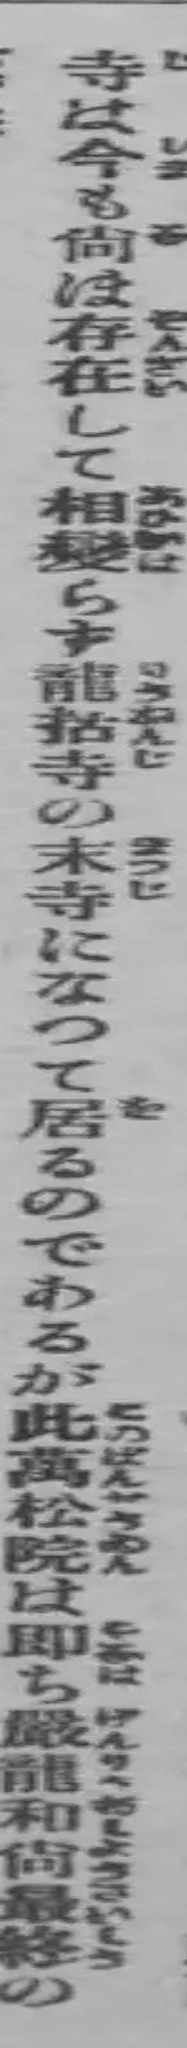寺は今も尚ほ存在して相変らず龍拈寺の末寺になつて居るのであるが此万松院は即ち厳龍和尚最終の
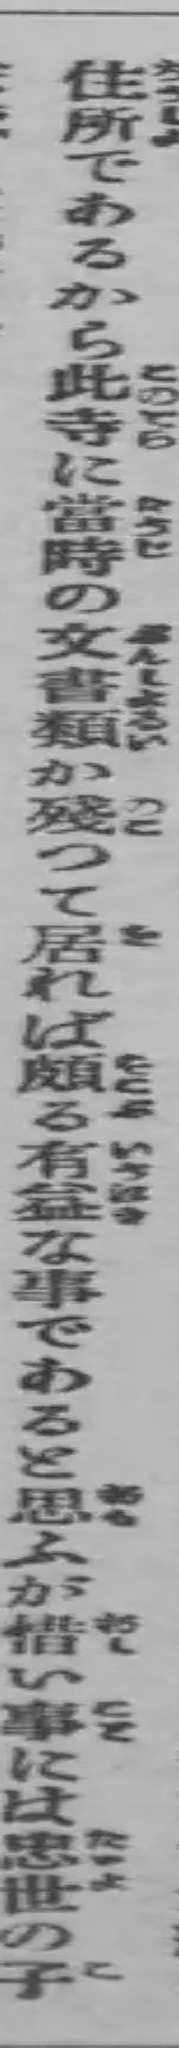住所であるから此寺に当時の文書類が残つて居れば頗る有益な事であると思ふが惜い事には忠世の子
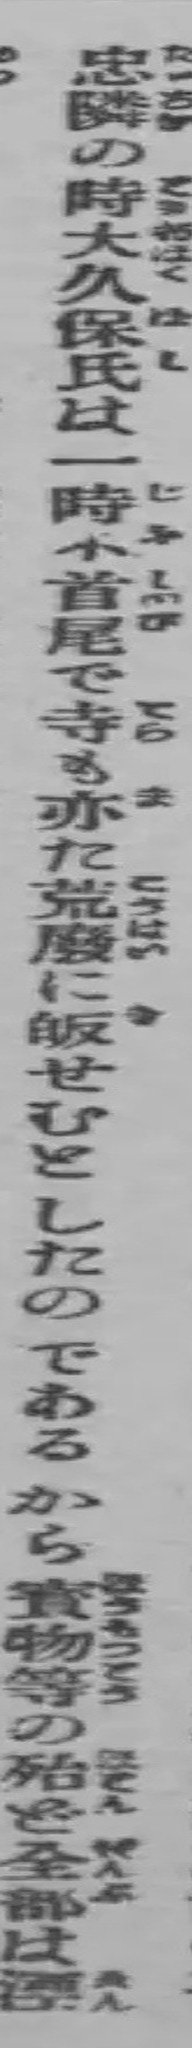忠隣の時大久保氏は一時不首尾で寺も亦た荒廃に皈せむとしたのであるから宝物等の殆ど全部は湮
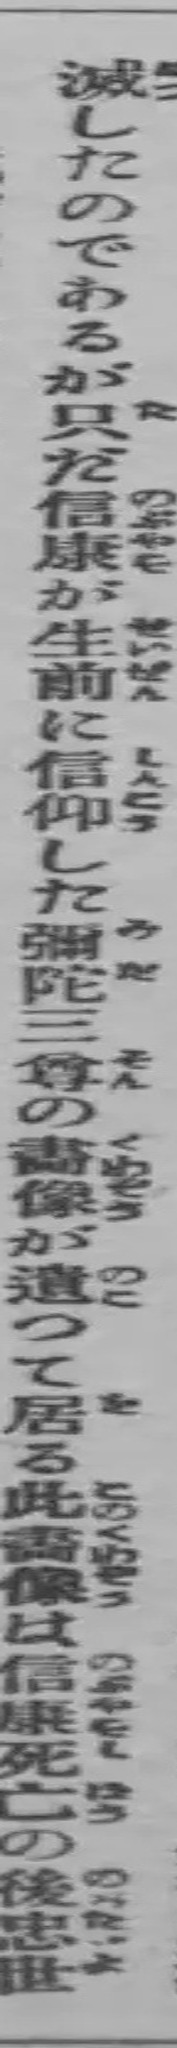滅したのであるが只だ信康が生前に信仰した弥陀三尊の画像が遺つて居る此画像は信康死亡の後忠世
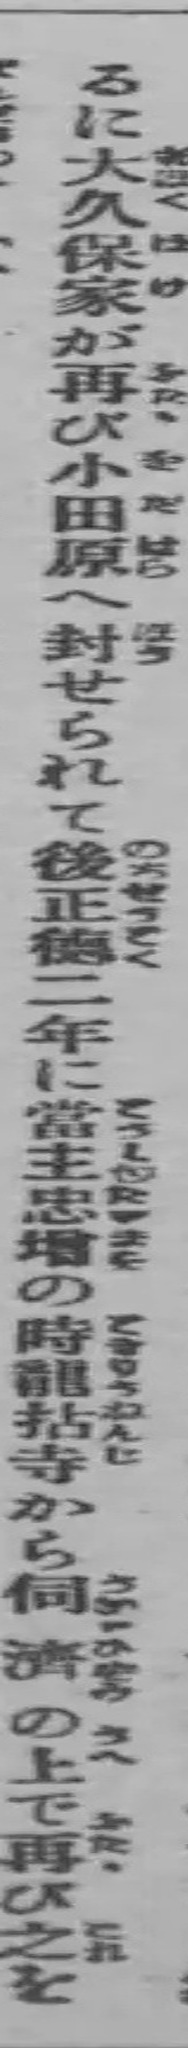るに大久保家が再び小田原へ封せられて後正徳二年に当主忠増の時龍拈寺から伺済の上で再び之を
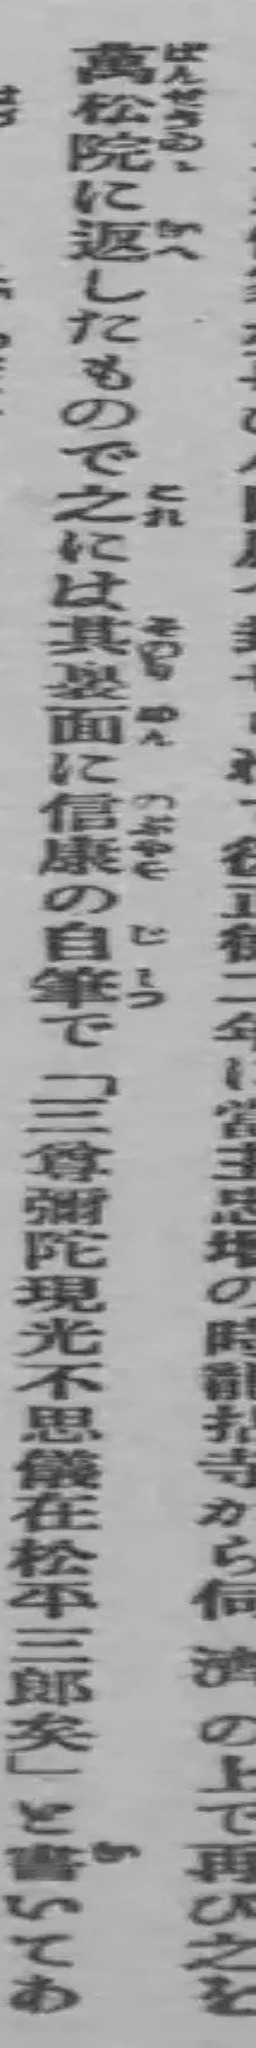万松院に返したもので之には其裏面に信康の自筆で「三尊弥陀現光不思儀在松平三郎矣」と書いてあ
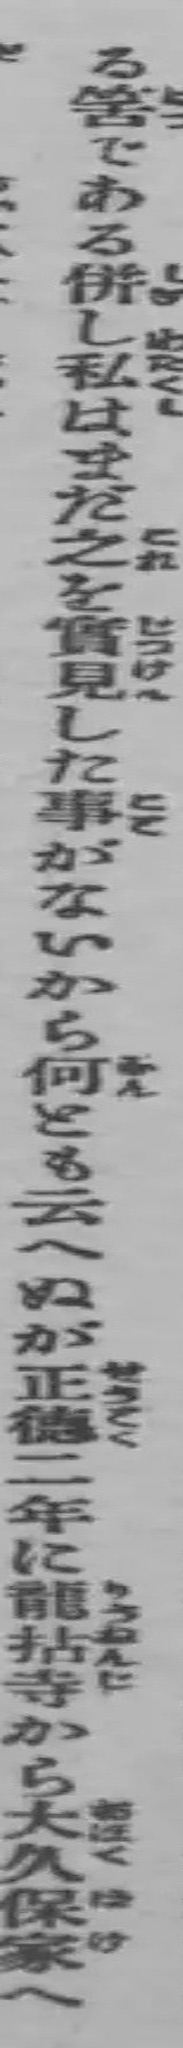る筈である併し私はまだ之を実見した事がないから何とも云へぬが正徳二年に龍拈寺から大久保家へ
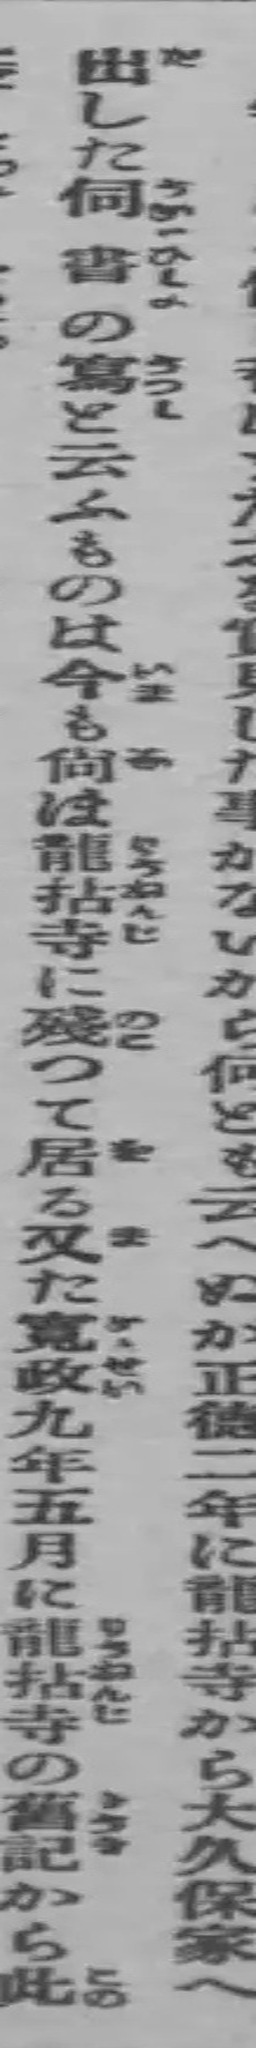出した伺書の写と云ふものは今尚ほ龍拈寺に残つて居る又た寛政九年五月に龍拈寺の旧記から此
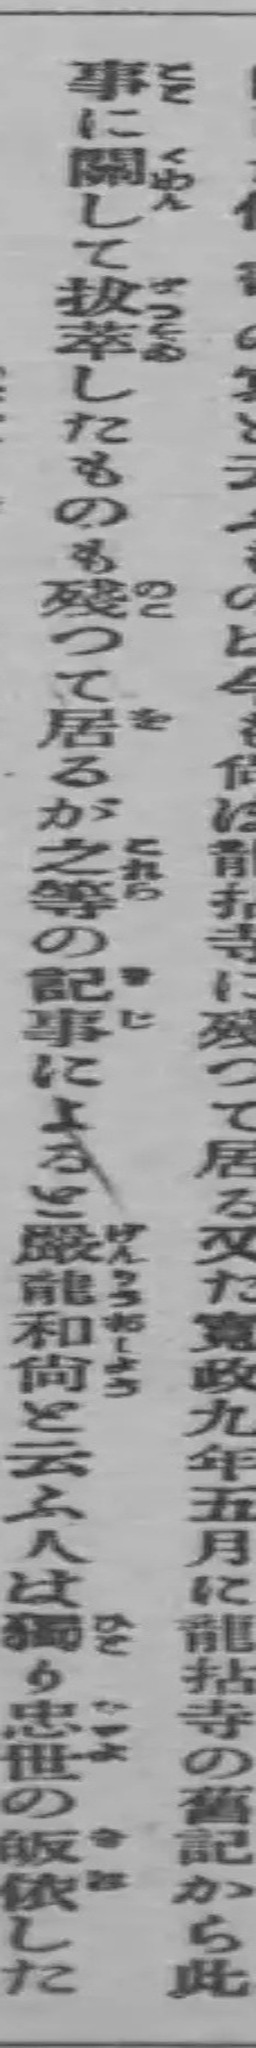事に関して抜萃したものも残つて居るが之等の記事によると厳龍和尚と云ふ人は独り忠世の皈依した
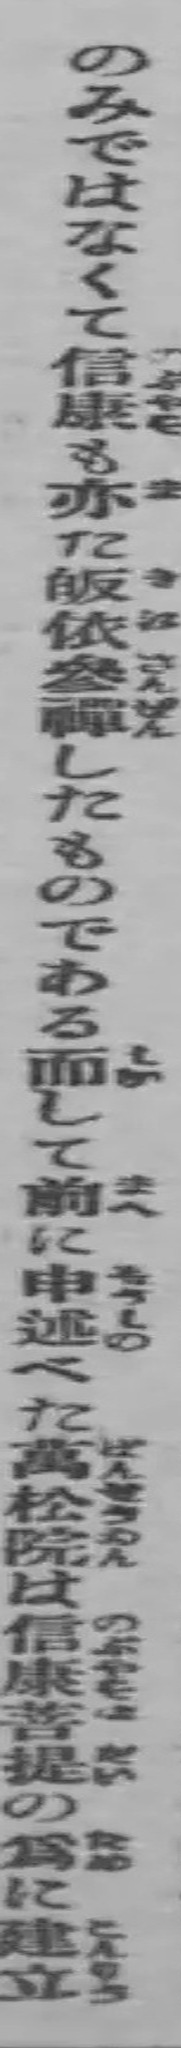のみではなくて信康も亦た皈依参禅したものである而して前に申述べた万松院は信康菩提の為に建立
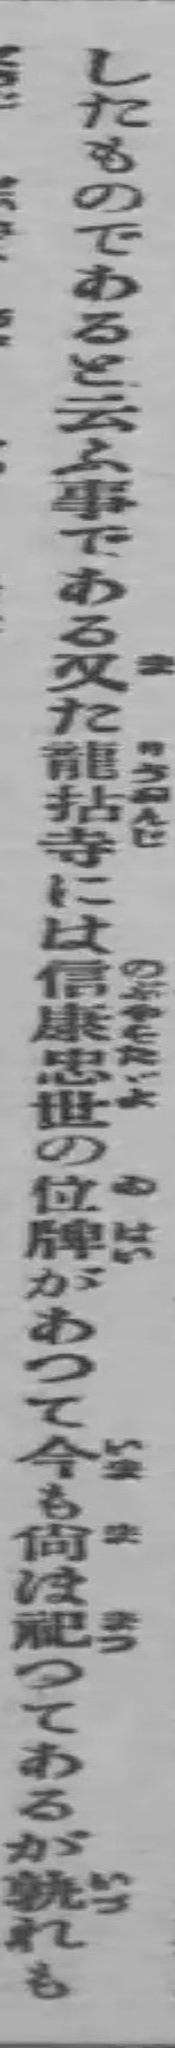したものであると云ふ事である又た龍拈寺には信康忠世の位牌があつて今も尚ほ祀つてあるが孰れも
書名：豊橋市史談
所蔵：国立国会図書館 National Diet Library, JAPAN
